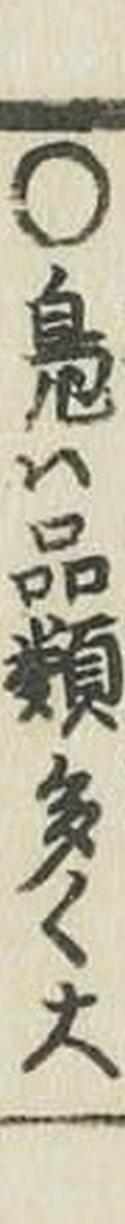○鳬は品類多く大
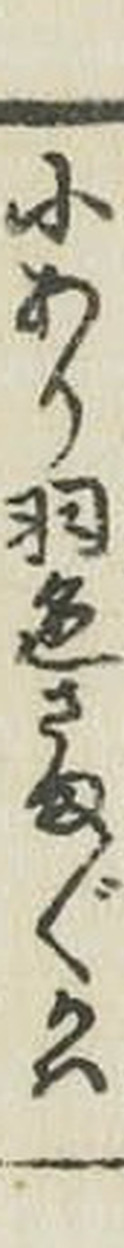小あり羽色さま〴〵かは
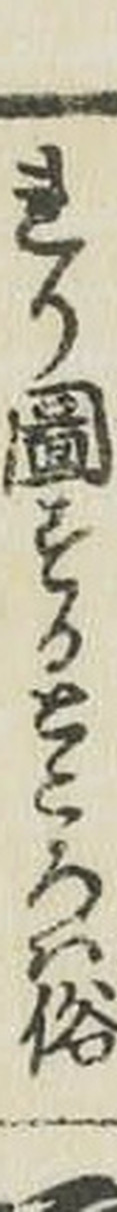れり図するところは俗
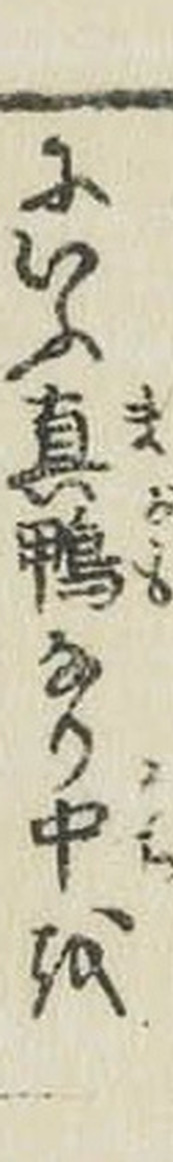にいふ真鴨なり中を
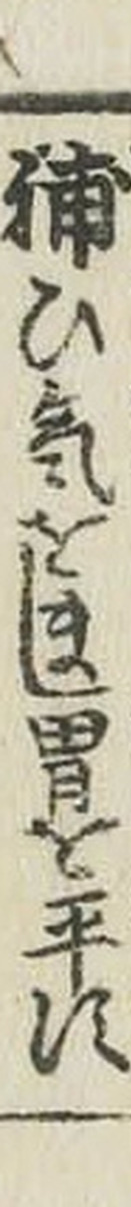補ひ気をまし胃を平す
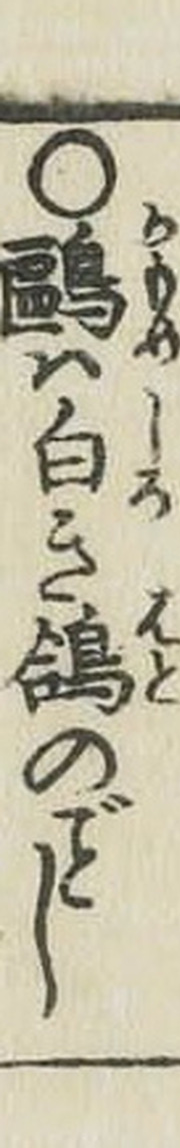○鴎は白き鴿のごとし
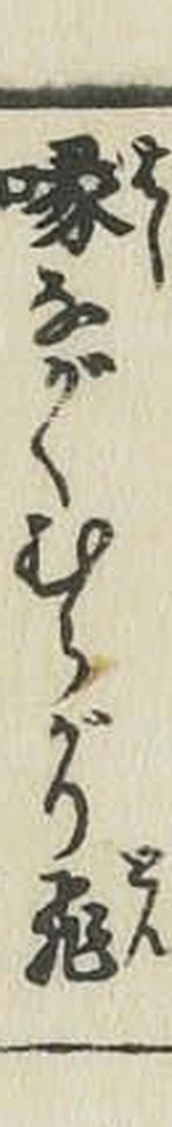喙ながくむらがり飛
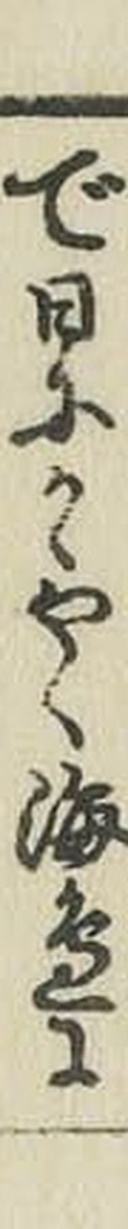で日にかゝやく海辺に
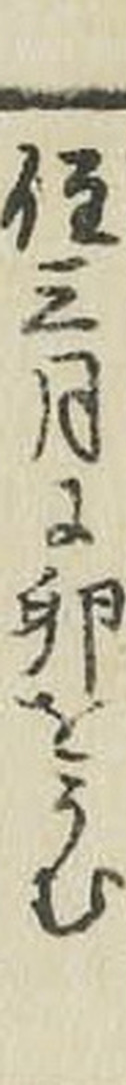住三月に卵をうむ
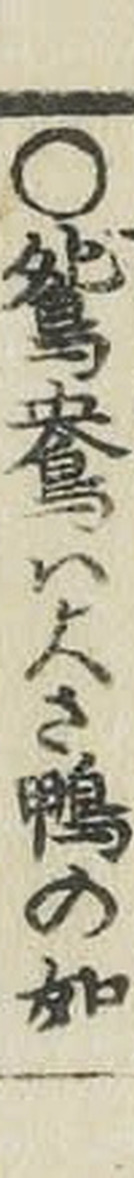○鴛鴦は大さ鴨の如
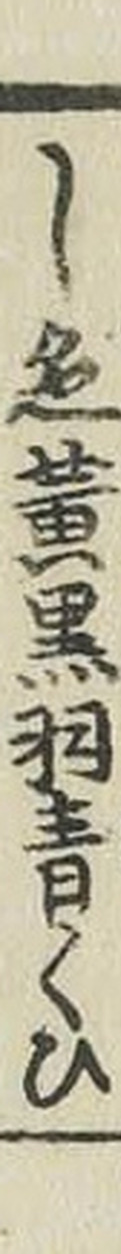し色黄黒羽青くひ
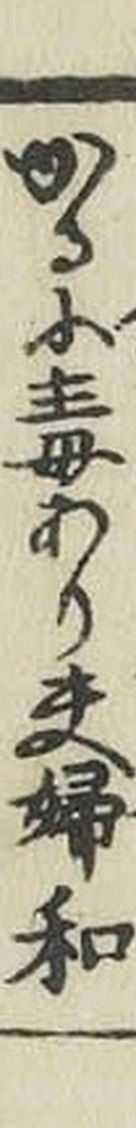かる小毒あり夫婦和
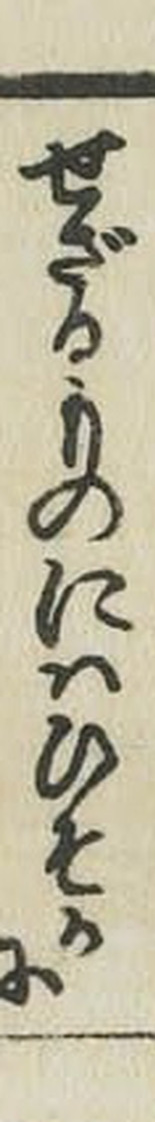せざるものにはひそかに

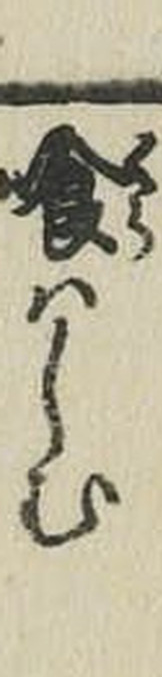喰はしむ
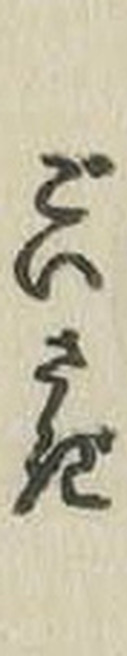ごいさぎ
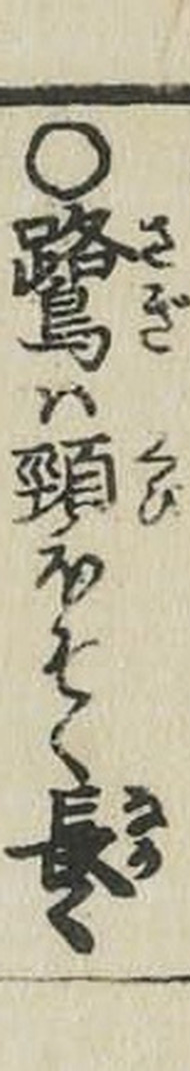○鷺は頸ほそく長く
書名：増補頭書訓蒙図彙大成 10巻 6:巻之12-13
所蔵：東京学芸大学教育コンテンツアーカイブ
